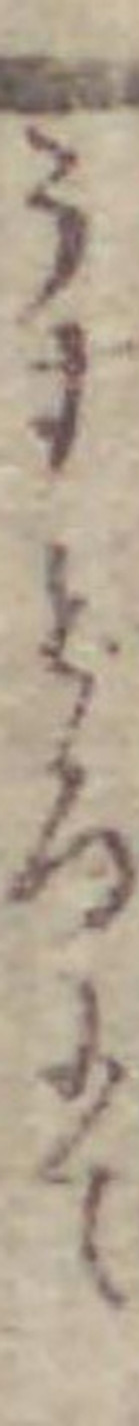うすどろにて
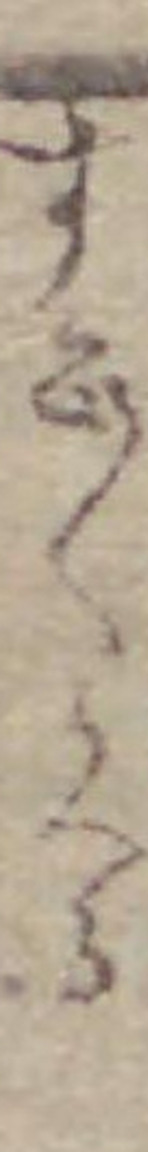すご〳〵かへる
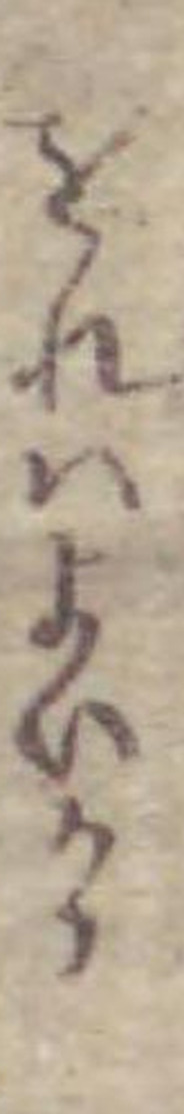をれはよいから
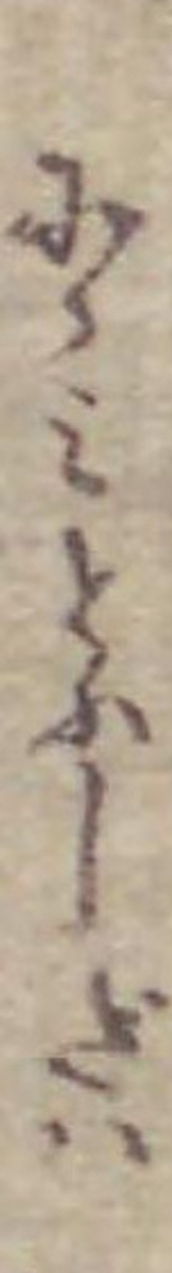にらみとふしだは
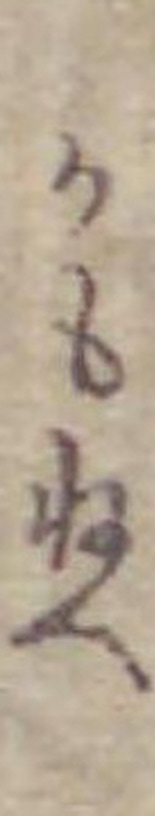かもねへ

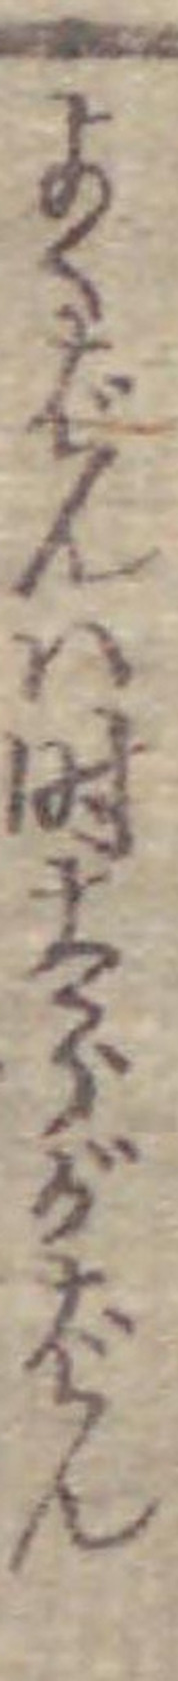よくばんは時太郎がばん
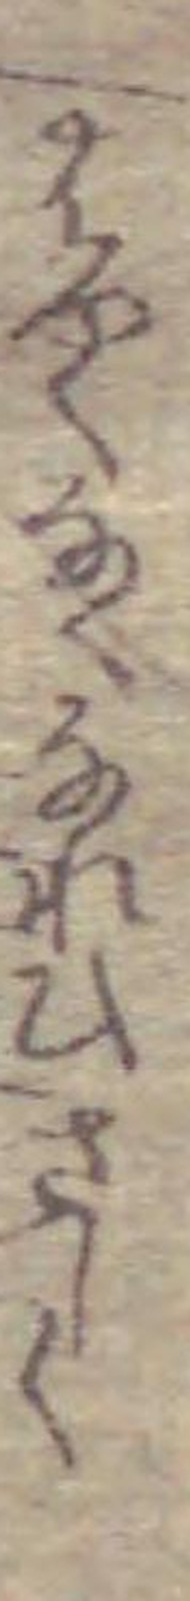はやくなくなれひさしく
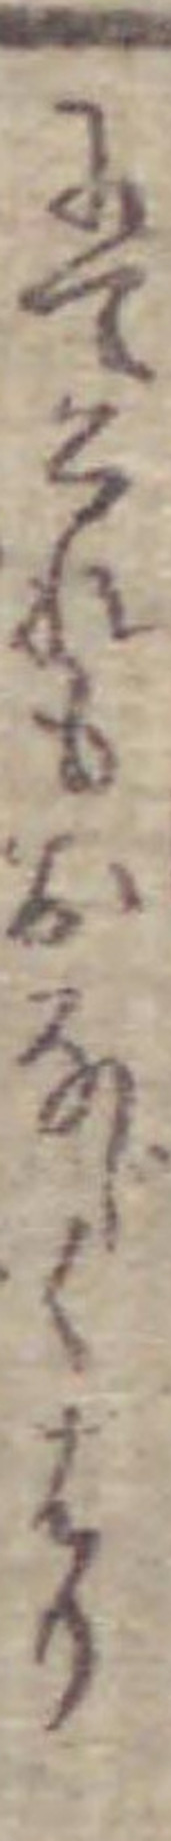にてこれもおなじくはり
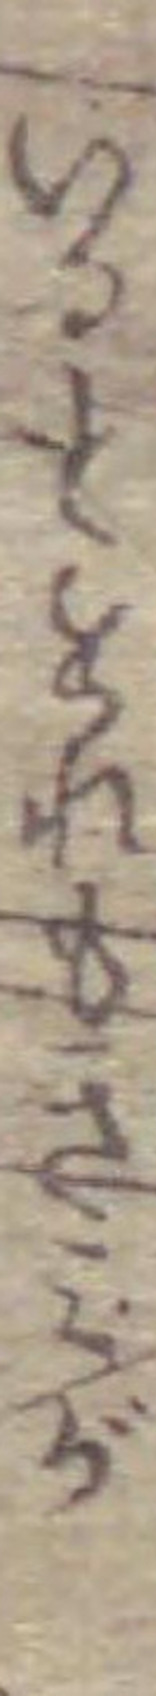いるとをれもきみが
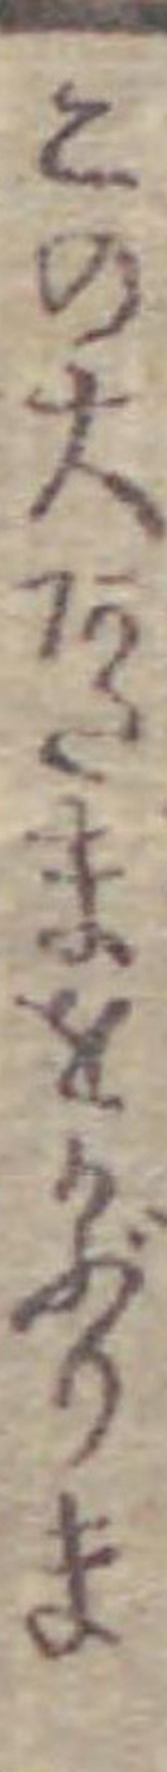この大あたまをかぶりま
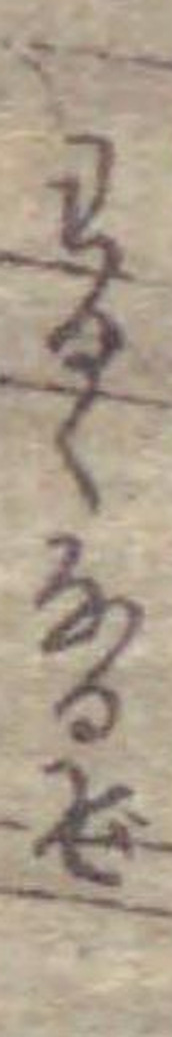わるくなるぞ
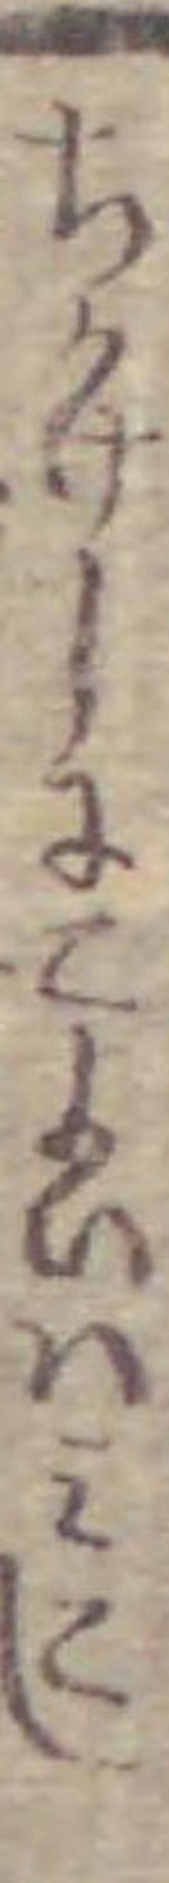ちうけしにこよいはみこし
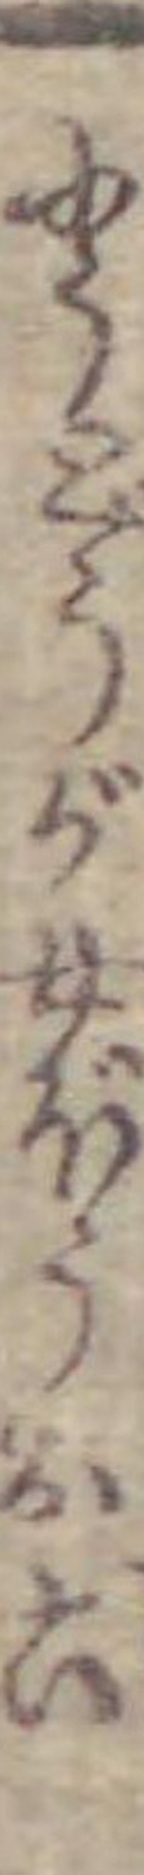にうどうが女ぼうお六
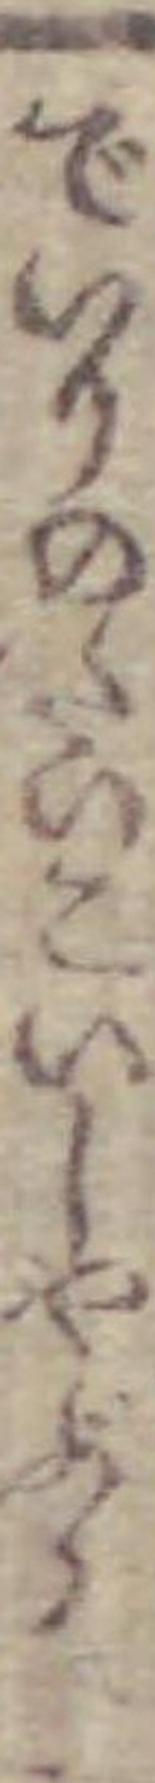でいりのたいこいしやぶら
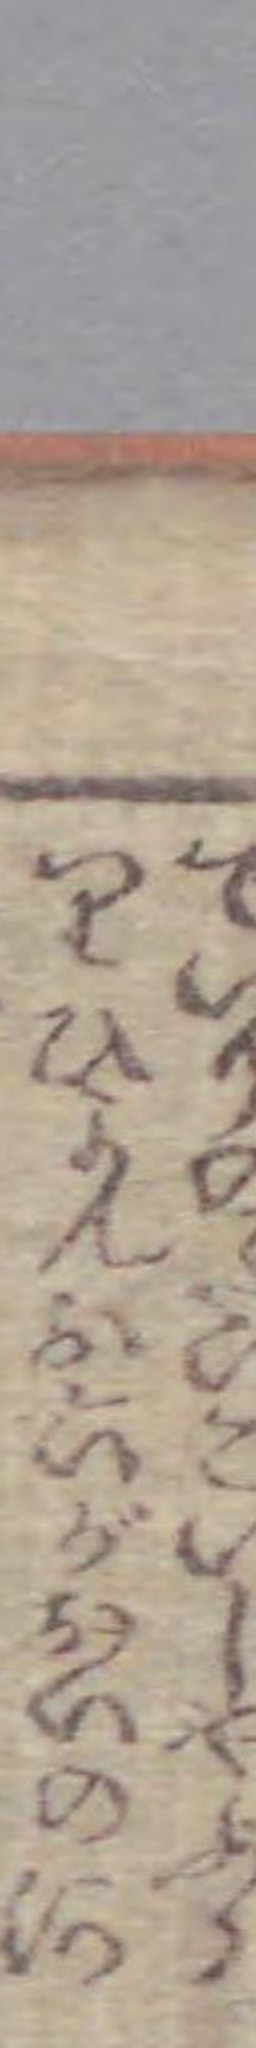りひよんお六がおいの河
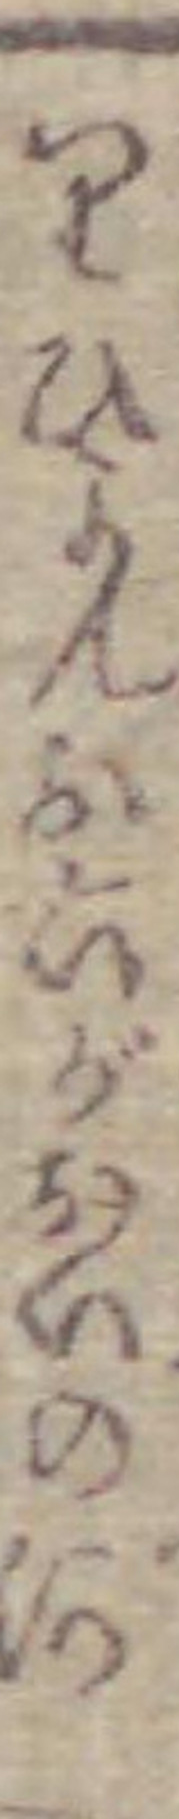りひよんお六がおいの河
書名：二日替 : 2巻
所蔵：国立国会図書館 National Diet Library, JAPAN
